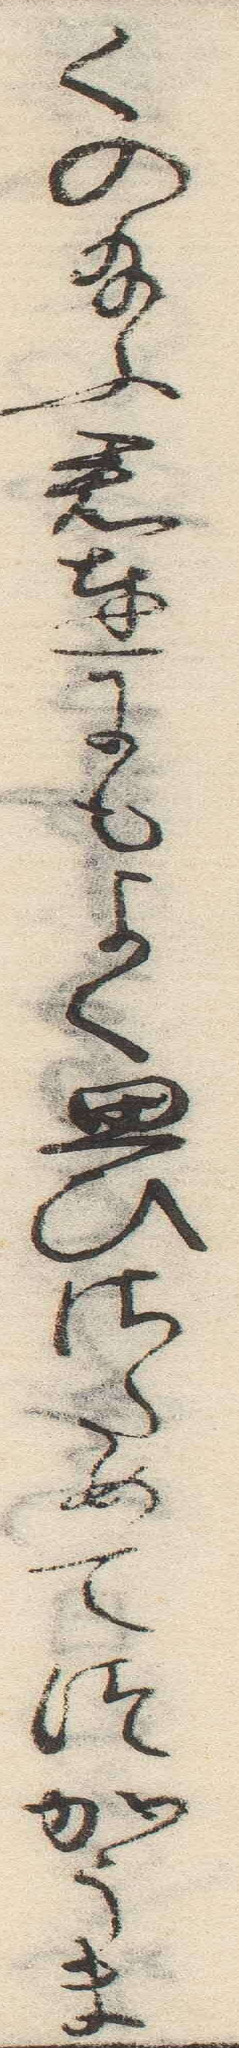くの給ふ君達にもよく思ひさためてつかうま
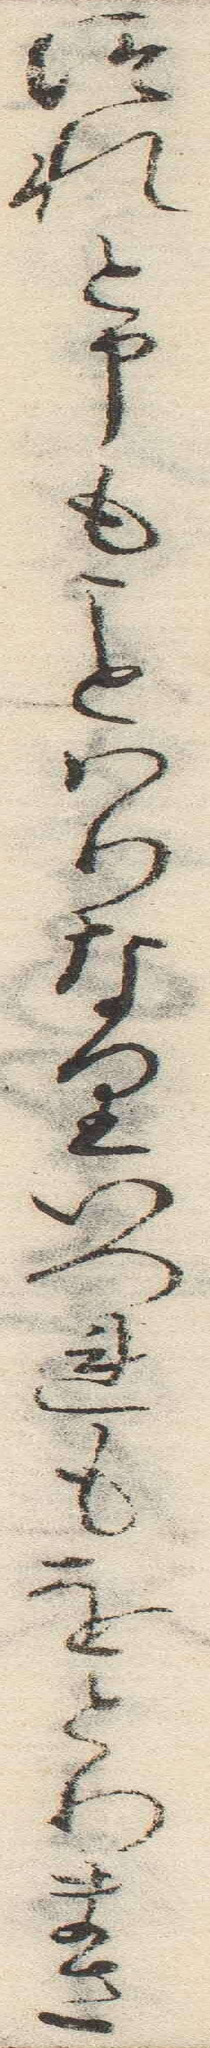つれと申もことはりなりいつれもをとりまさ
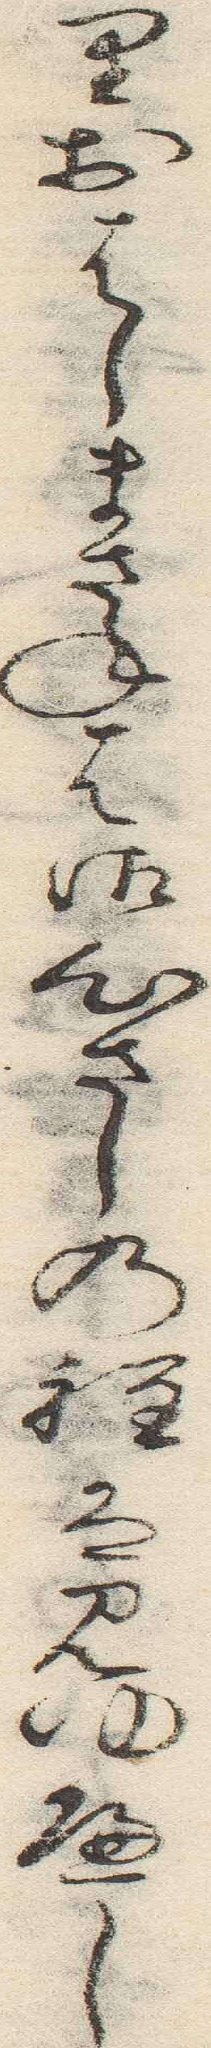りおはしまさねは御心さしの程は見ゆへし
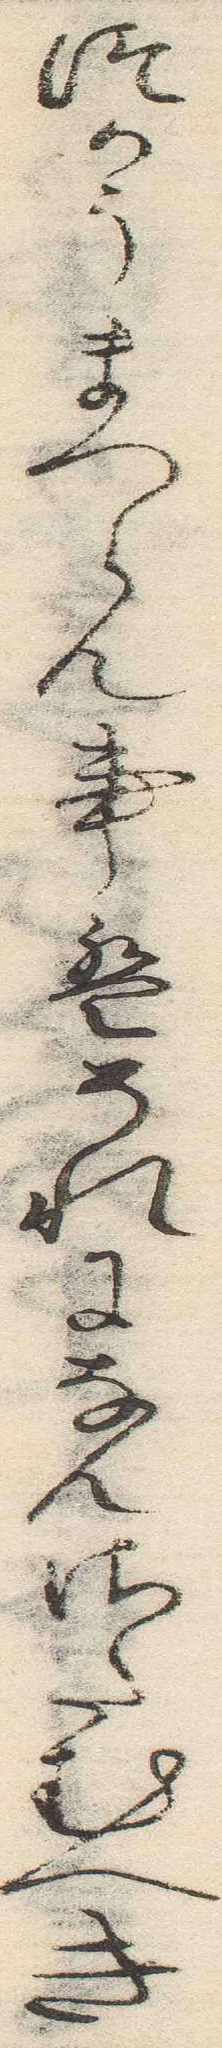つかうまつらん事はそれになんつたむへき
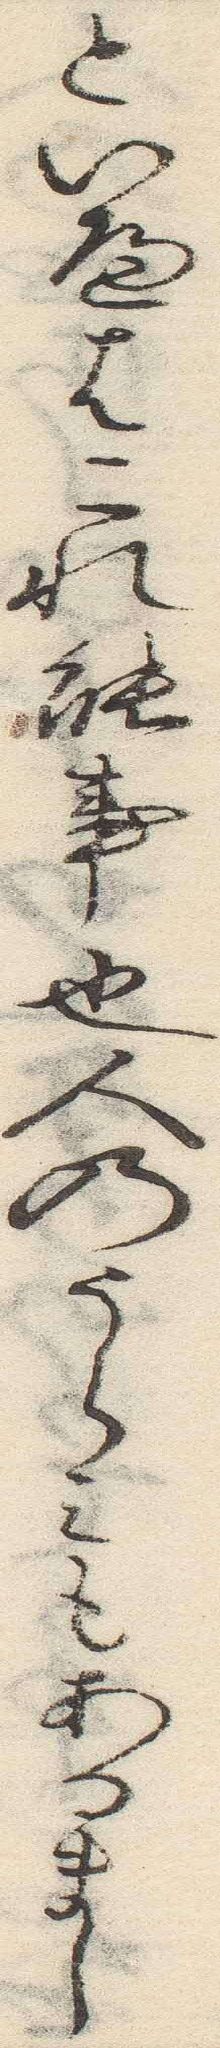といへはこれ能事也人のうらみもあるまし
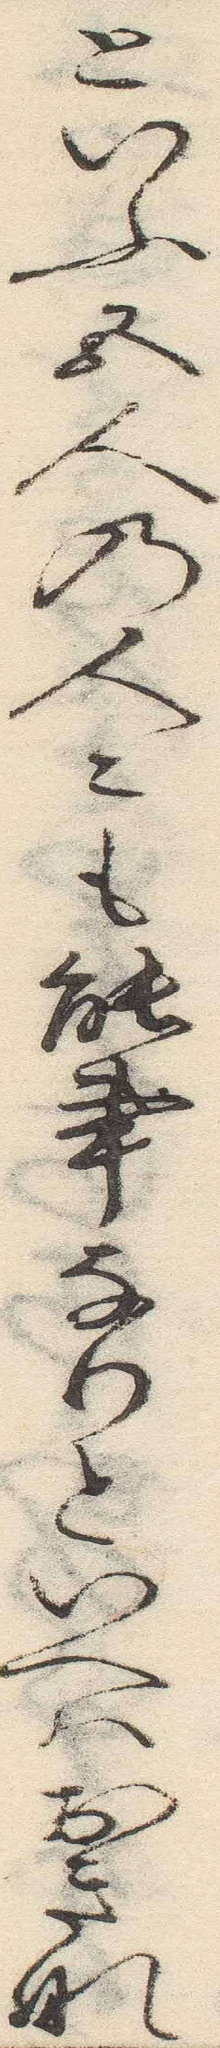といふ五人の人とも能事なりといへはおきな
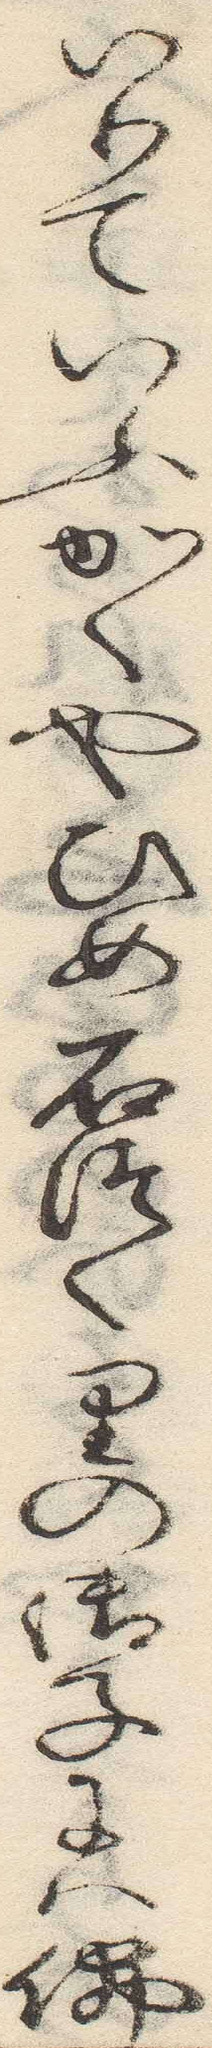いりていふかくやひめ石つくりの御子には仏
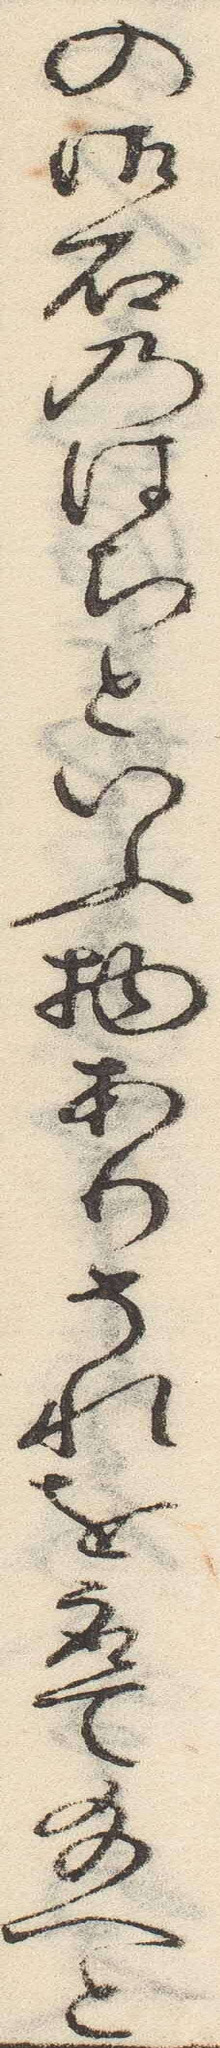の御石のはちといふ物ありそれを取て給へと
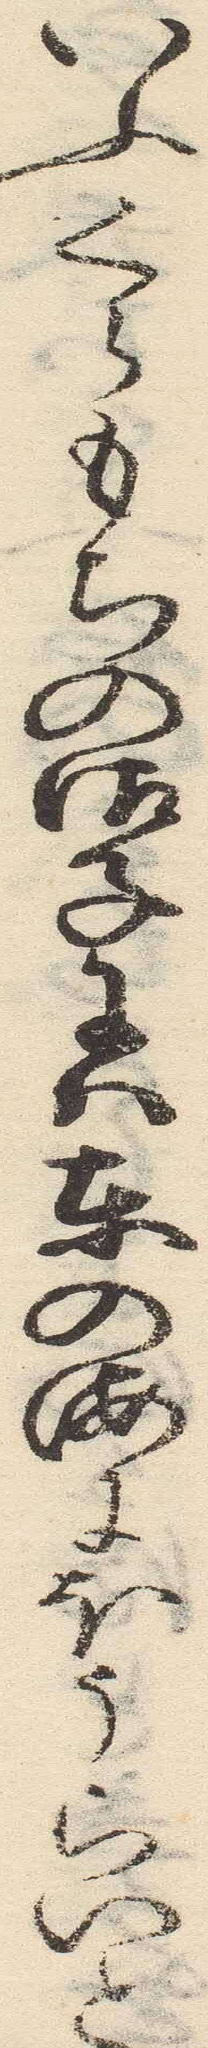いふくらもちの御子には東の海にほうらいと
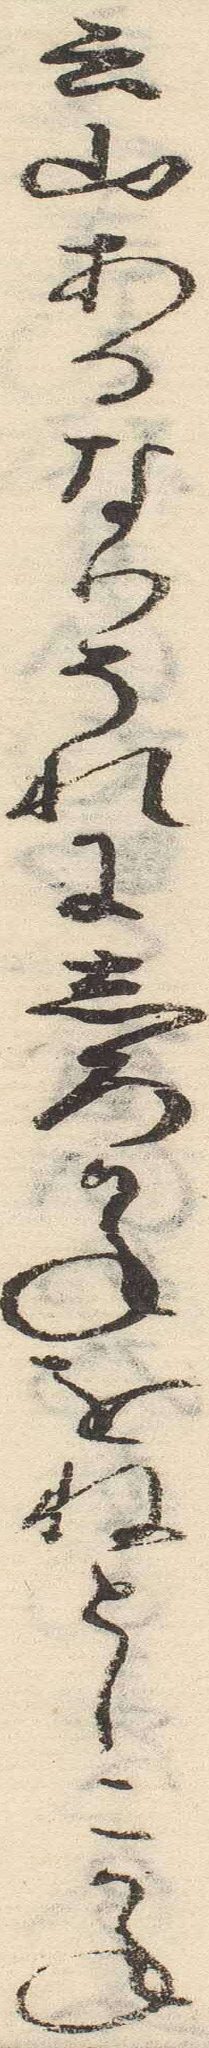云山あるなりそれにしろかねをねとしこかね
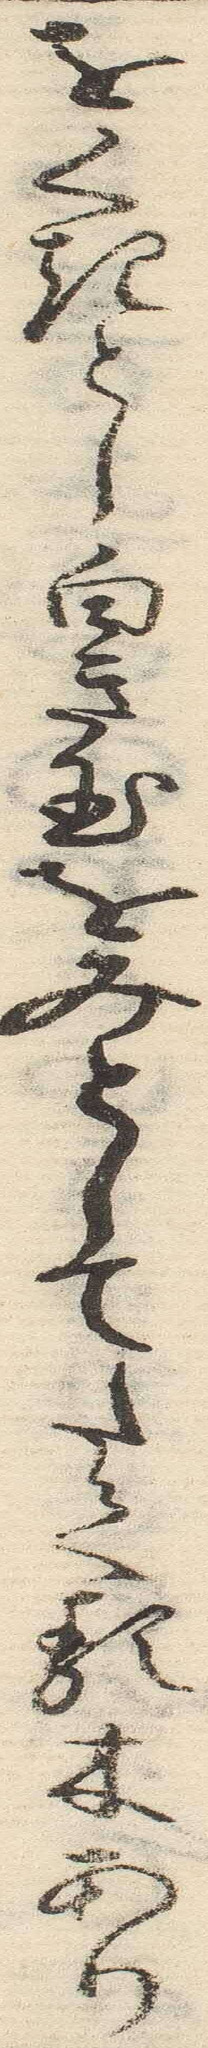をくきとし白き玉をみとしてたてる木あり
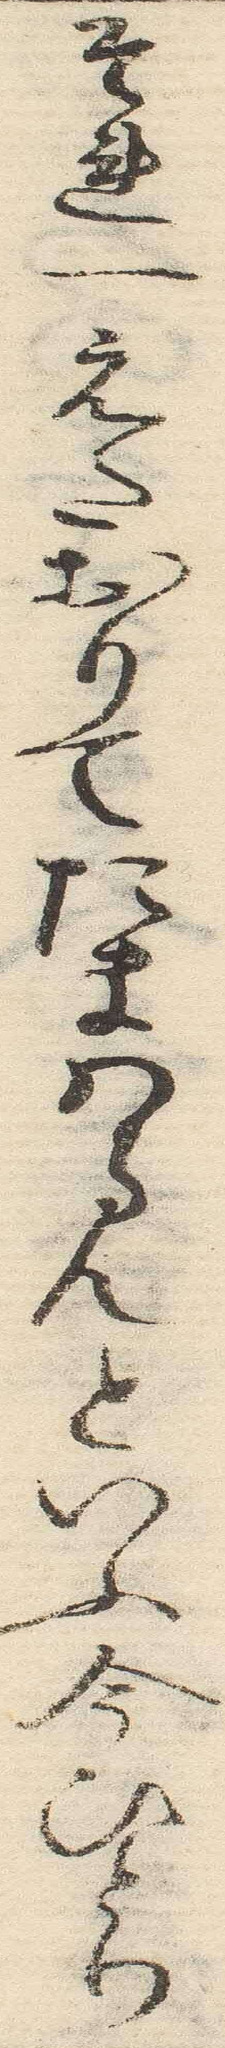それ一えたおりてたまはらんといふ今ひとり
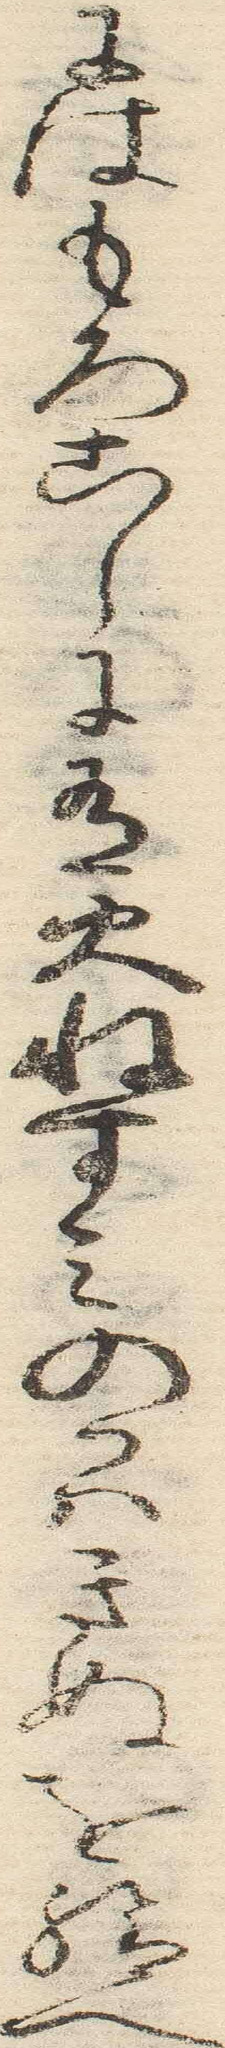にはもろこしに有火ねすみのうはきぬを給へ
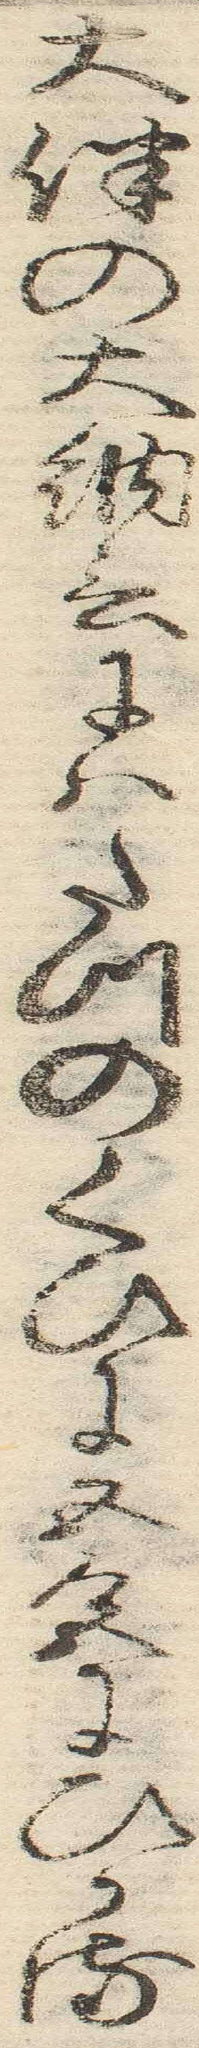大伴の大納言にはたつのくひに五色にひかる
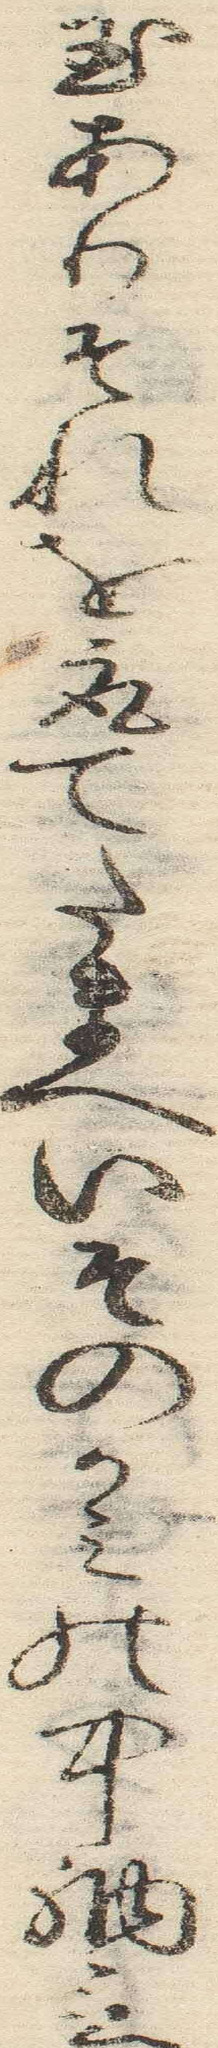玉ありそれを取てたまへいそのかみの中納言
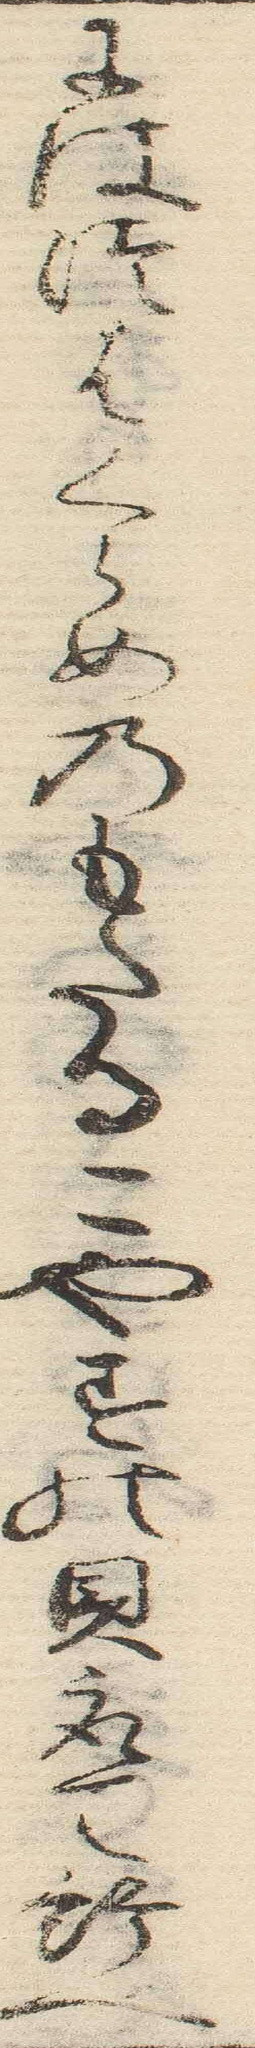にはつはくらめのもたるこやすの貝取て給へ
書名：竹取物語
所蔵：東京学芸大学附属図書館 国文学研究資料館
